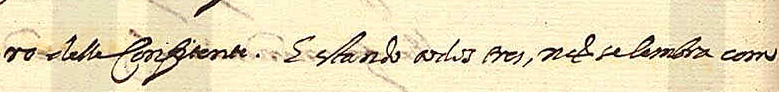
ro delle Confitente. E estando todos tres, naõ se lembra com
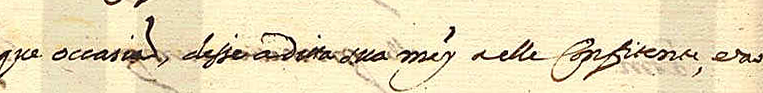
que occasiaõ, disse a ditta sua mãy a elle Confitente, e ao
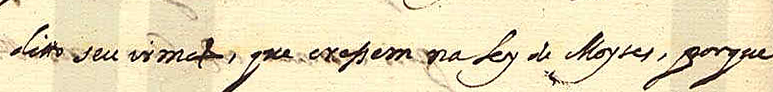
ditto seu irmaõ, que cressem na Ley de Moyses, porque
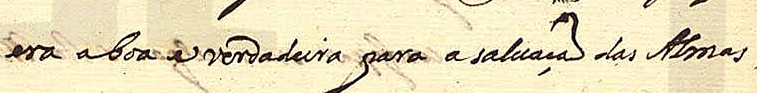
era a boa e verdadeira para a saluaçaõ das Almas,
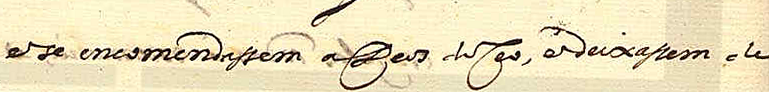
e se encomendassem a Deos do Ceo, e deixassem de
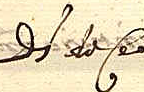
Ds̄ do Ceo
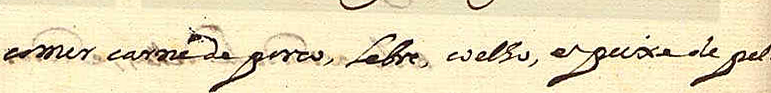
comer carne de porco, Lebre, coelho, e peixe de pel
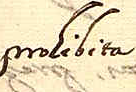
prohibita
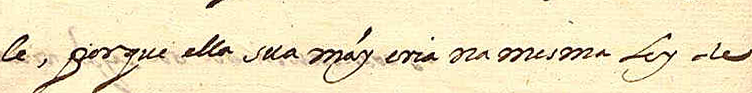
le, porque ella sua mãy cria na mesma Ley de
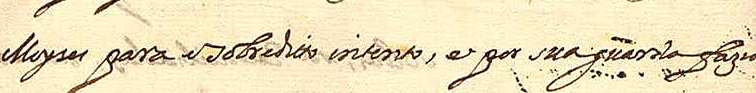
Moyses para o sobreditto intento, e por sua guarda fazia
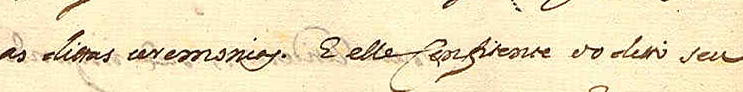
as dittas ceremonias. E elle Confitente e o ditto seu
